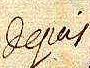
depois
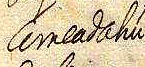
com cada hū
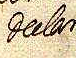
declar.
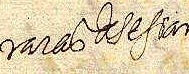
razaõ de se fiar
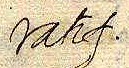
ratif.
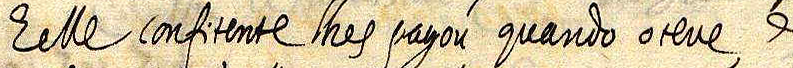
E elle confitente lhes pagou quando o teue, E
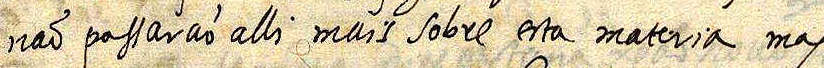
naõ passaraõ alli mais sobre esta materia mas
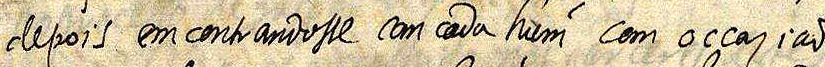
depois emcontrandosse com cada hum com occaziaõ
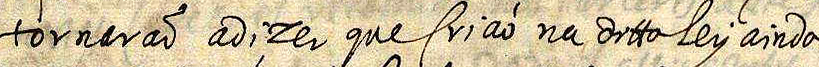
tornaraõ a dizer que Criaõ na ditta Ley ainda
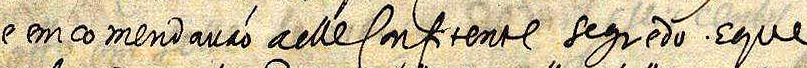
e emcomendauaõ a elle Confitente segredo. E que
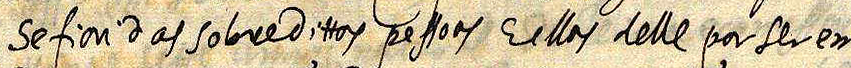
Se fiou das sobredittas pessoas E ellas delle por serem
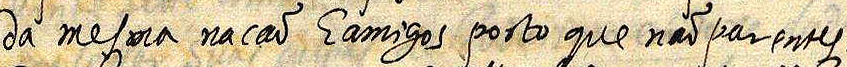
da mesma naçaõ E amigos posto que naõ parentes
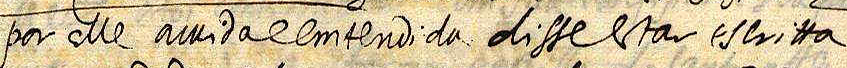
por Elle ouuida e emtendida disse estar escritta
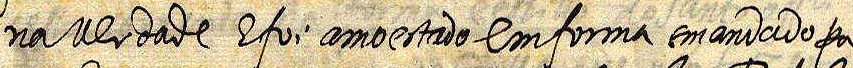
na uerdade E foi amoestado em forma e mandado ꝑa
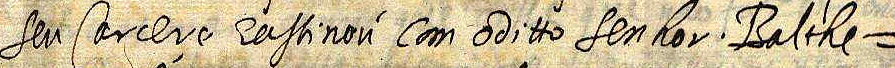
seu Carcere E assinou com o ditto senhor. Balthe
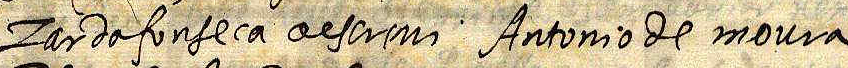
zar da fonseca o escreui Antonio de moura
